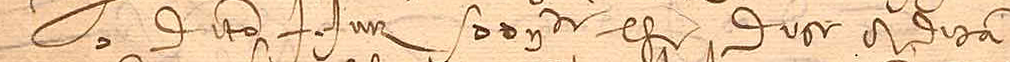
o dit̄o Jejum soomte lhe dise A dita
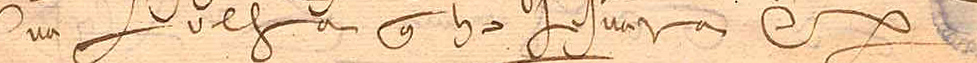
sua filha q̄ ho JeJuara e ꝑ
